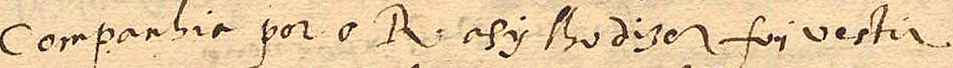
companhia por o R. asy lho dizer foy uestir
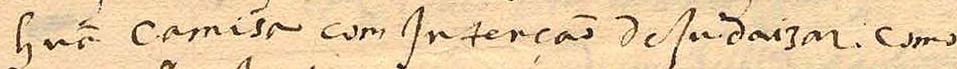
hu̅a camisa com Jntença̅o de judaizar como
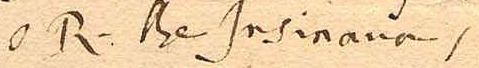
o R. lhe Jnsinaua /
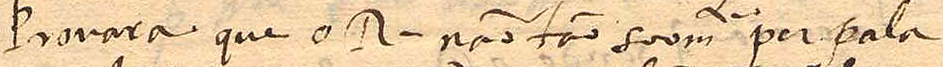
Prouara que o R. na̅o tão soomte per pala
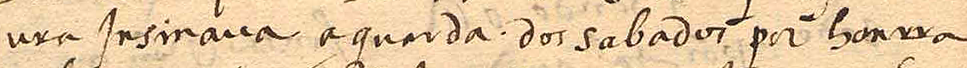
ura Jnsinaua a guarda dos sabados por honrra
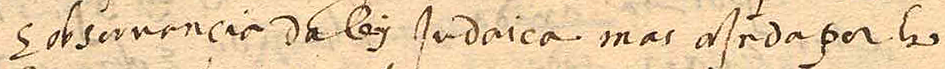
E obseruançia da ley judaica mas ajnda por ho
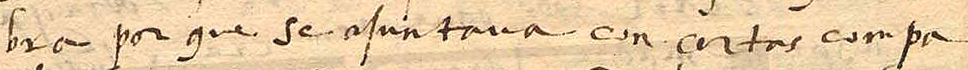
bra por que se ajuntaua con çertas compa
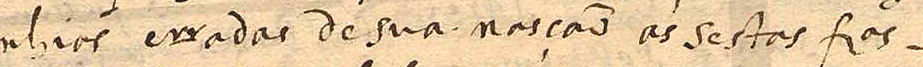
nhias erradas de sua nasça̅o as sestas fras
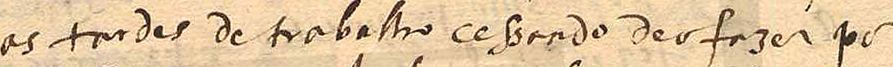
as tardes de trabalho cessando de o fazer por
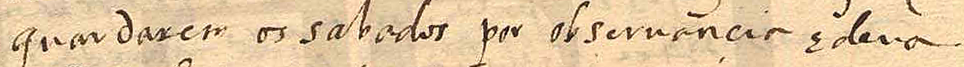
guardarem os sabados por obseruançia E deua
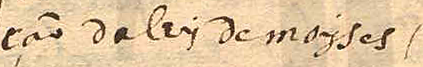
ção da ley de moyses /
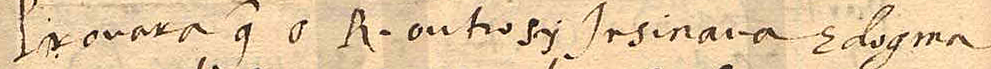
Prouara q̅ o R. outrosy Jnsinaua E dogma
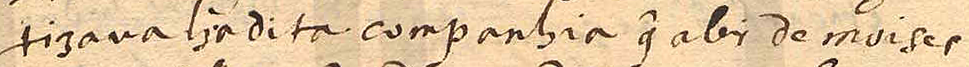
tizaua ha dita companhia q̅ a ley de moises
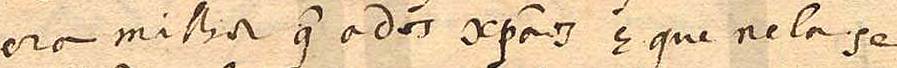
era milhor q̅ a dos xpãos E que nela se
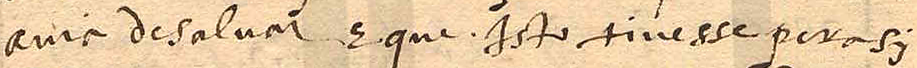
auia de saluar E que Jsto tiuesse pera sy
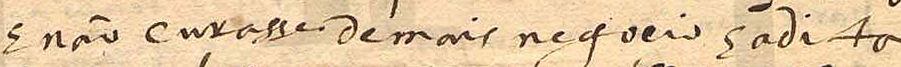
E não curasse de mais negoçio E a dita
